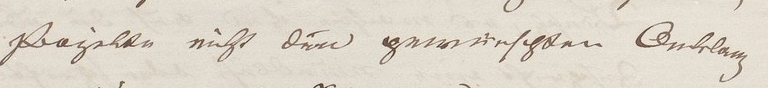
Projekte nicht den gewünschten Anklang
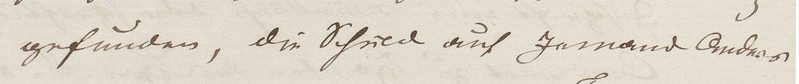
gefunden, die Schuld auf Jemand Anders
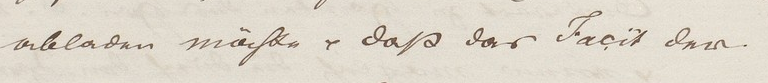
abladen möchte & daß das Facit der
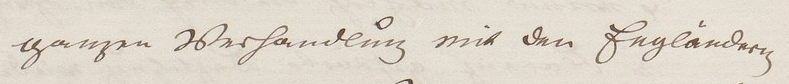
ganzen Verhandlung mit den Engländern
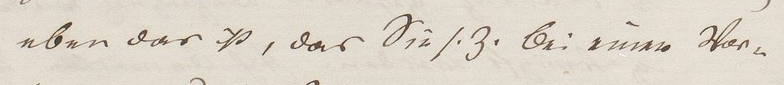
eben das ist, das Sie s. Z. bei einer Vor-
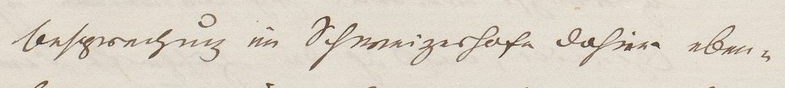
besprechung im Schweizerhofe dahier eben-
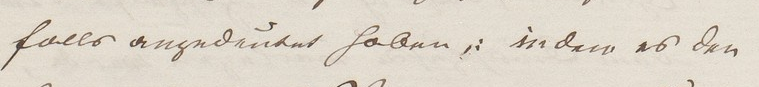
falls angedeutet haben,: indem es den
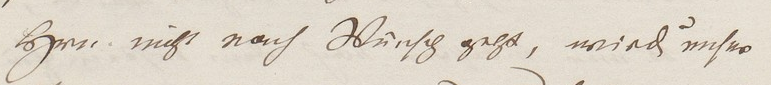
Hrn. nicht nach Wunsch geht, wird unser
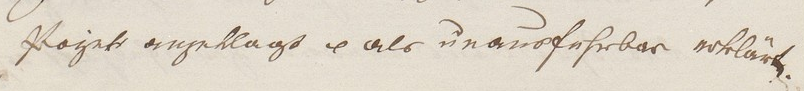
Projekt angeklagt & als unausführbar erklärt.
